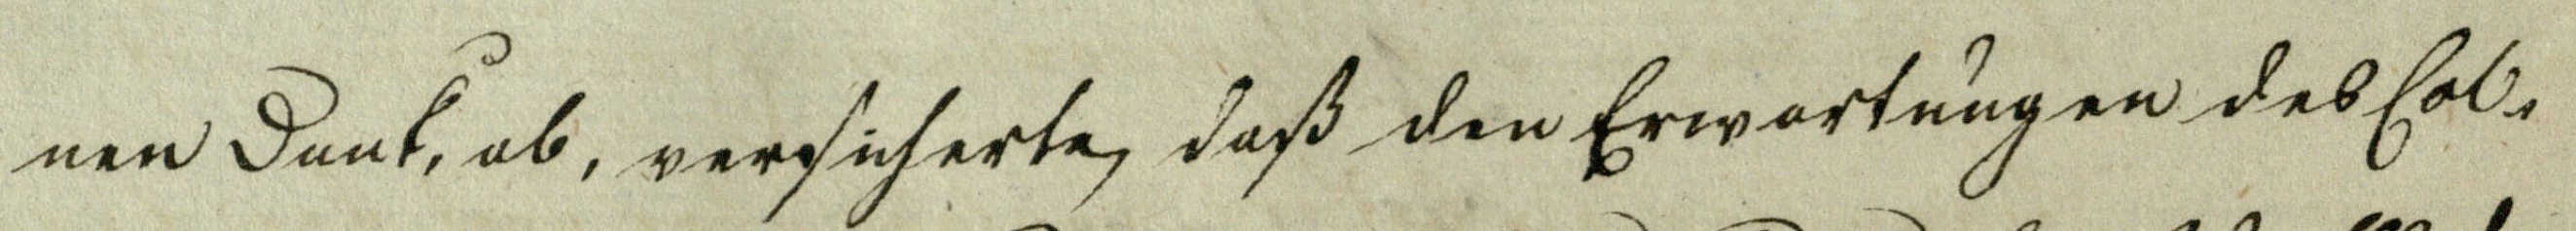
nen Dank ab, versicherte, daß den Erwartungen des Col¬
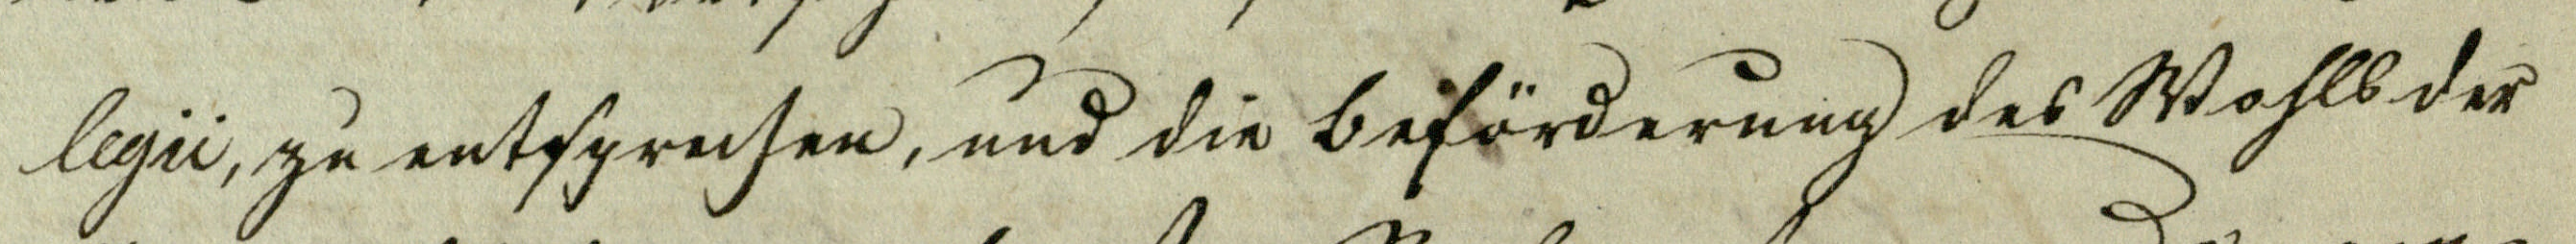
legii, zu entsprechen, und die Beförderung des Wohls der
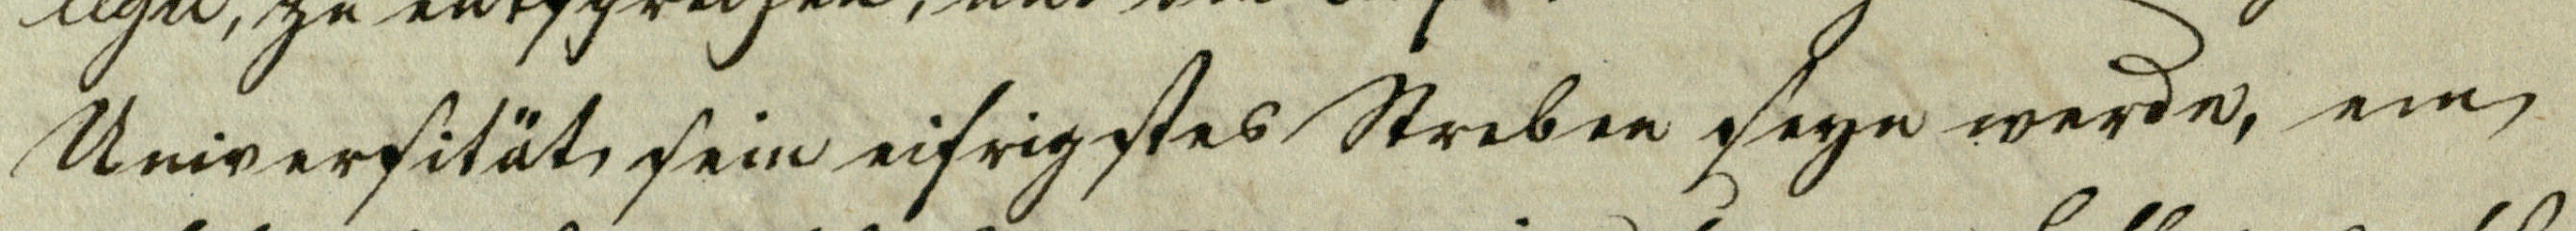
Universität sein eifrigstes Streben seyn werde, em¬
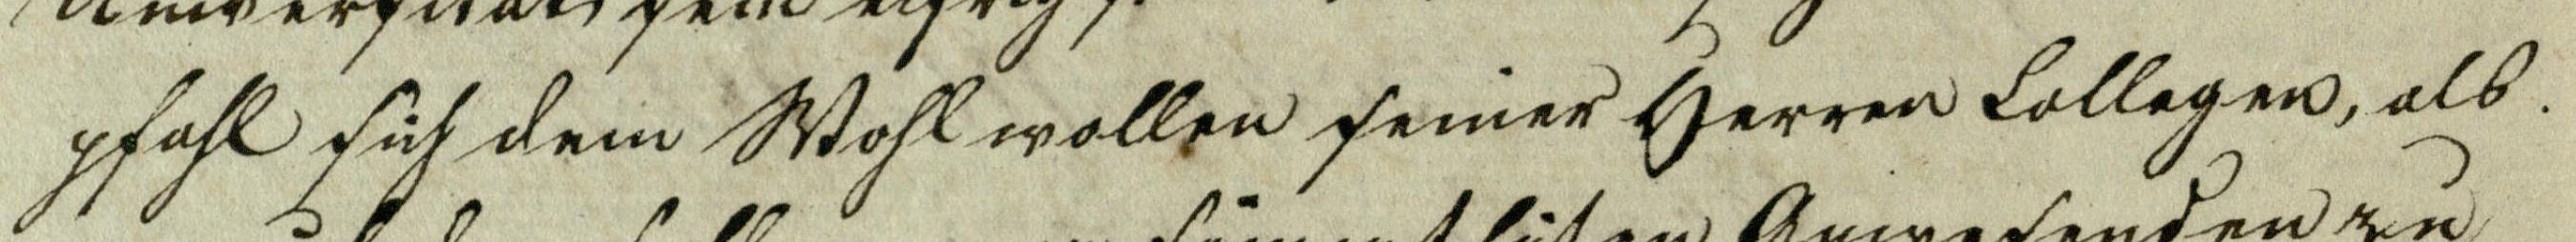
pfahl sich dem Wohl wollen seiner Herren Collegen, als
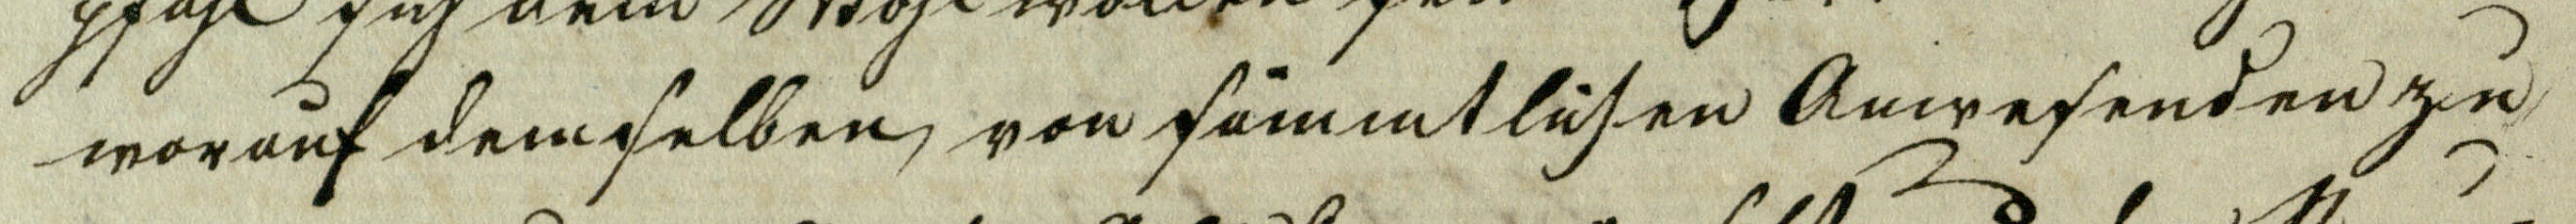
worauf demselben, von sämmtlichen Anwesenden zu
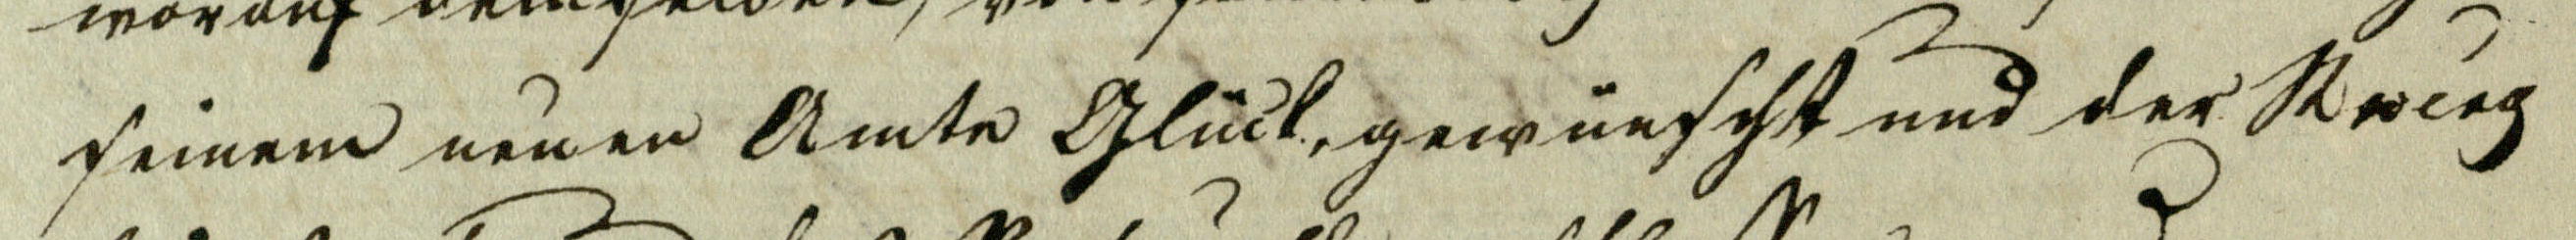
seinem neuen Amte Glück gewünscht und der Recep¬
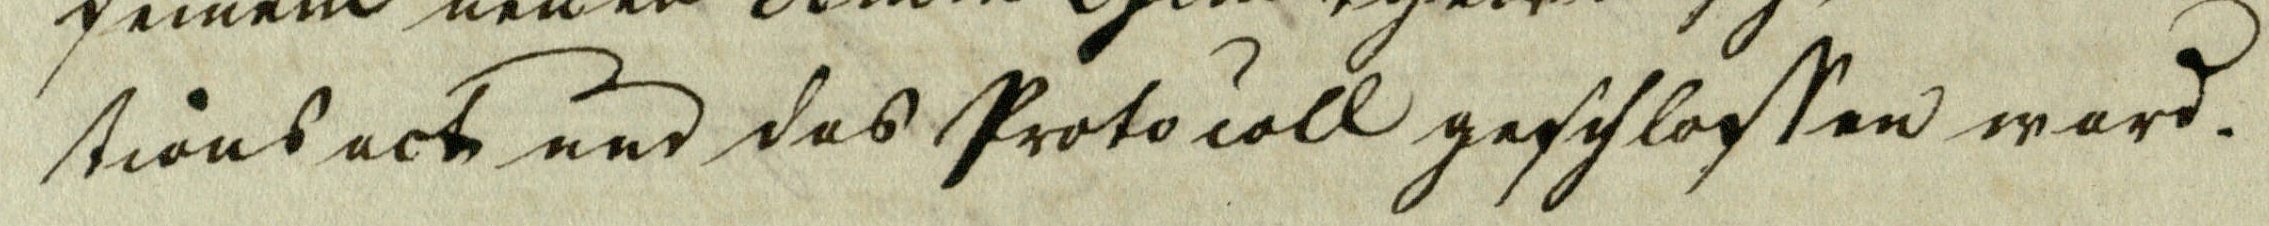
tionsact und das Protocoll geschlossen ward.
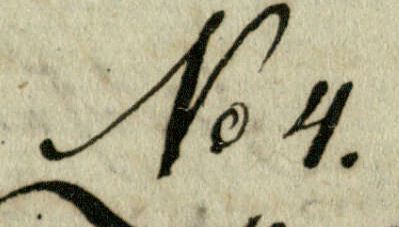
Nº 4.
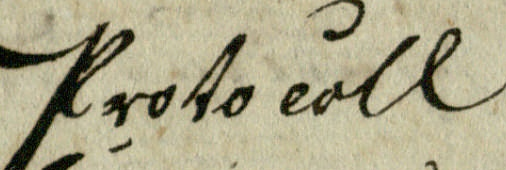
Protocoll
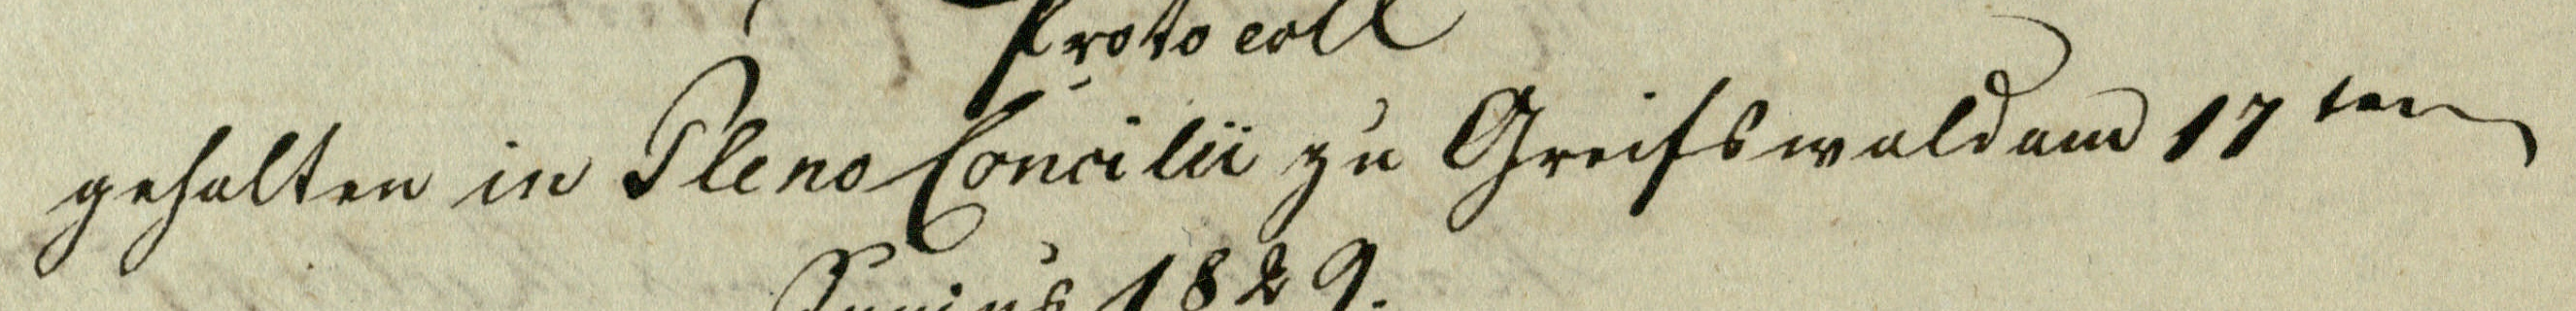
gehalten in Pleno Concilii zu Greifswald am 17ten
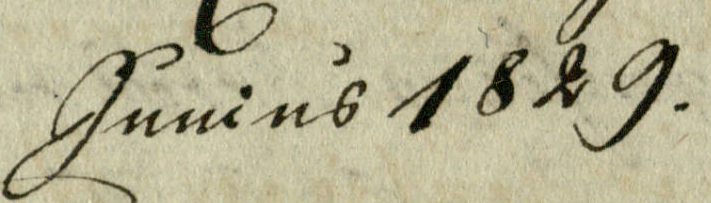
Junius 1829.
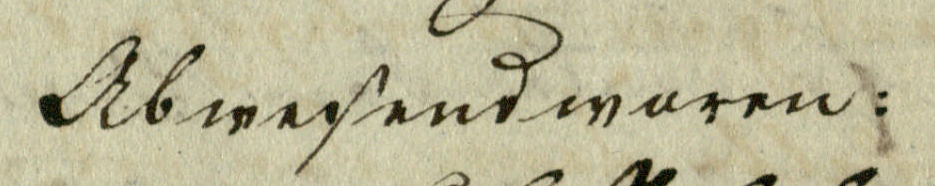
Abwesend waren:
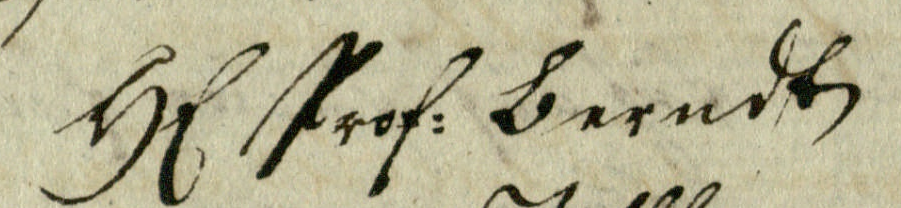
HE Prof: Berndt,
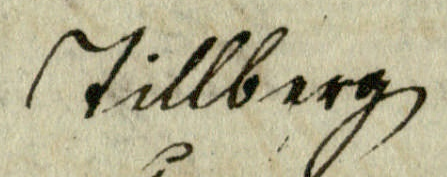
Tillberg,
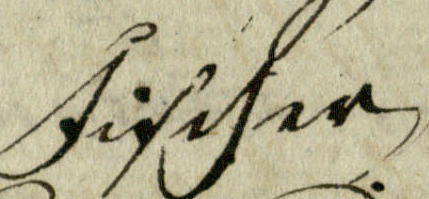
Fischer,
